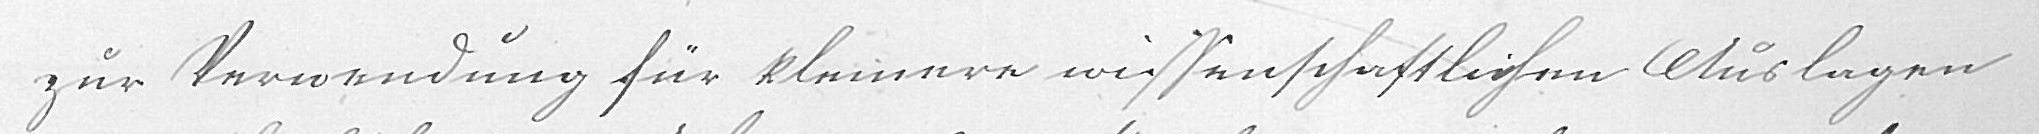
zur Verwendung für kleinern wissenschaftlichen Auslagen
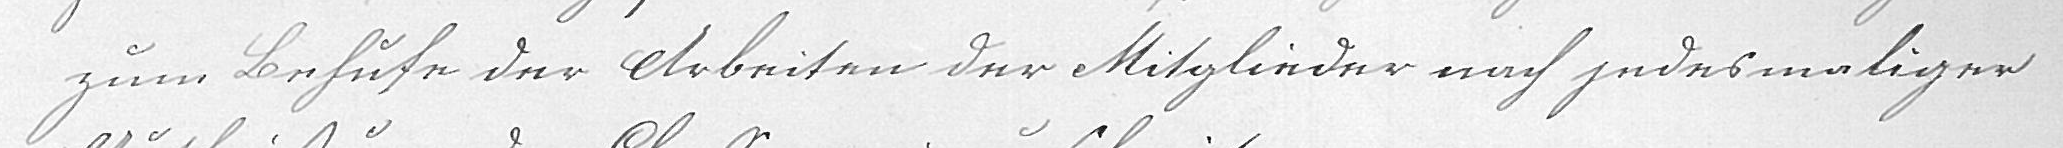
zum Behufe der Arbeiten der Mitglieder nach jedesmaliger
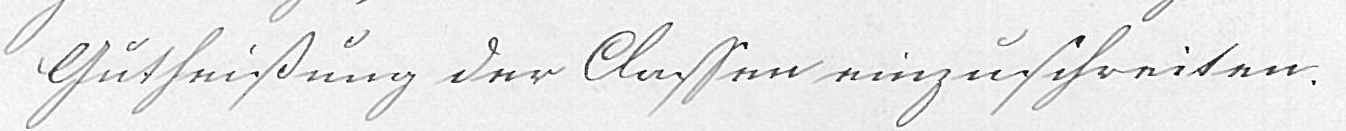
Gutheißung der Classen einzuschreiten.
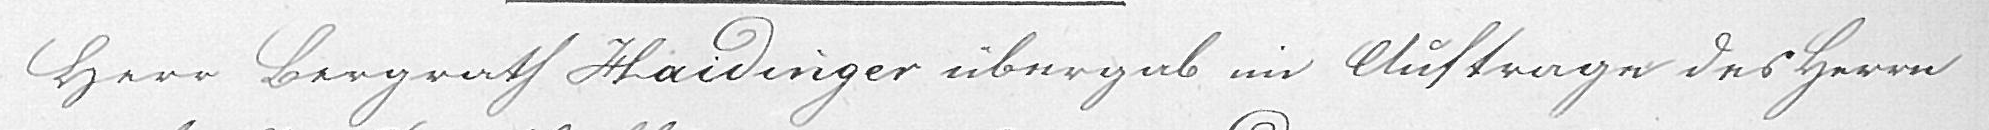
Herr Bergrath Haidinger übergab im Auftrage des Herrn
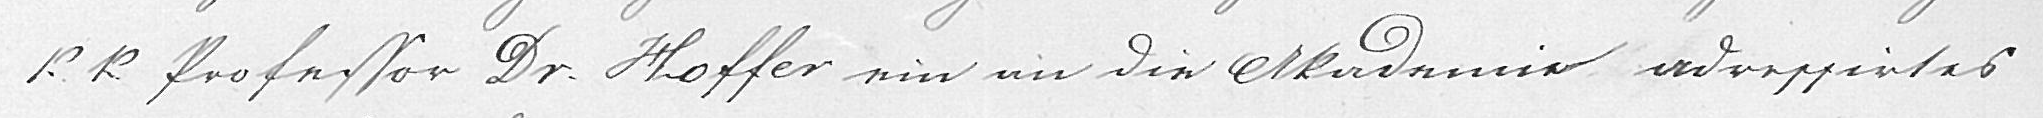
k.k. Professor Dr. Hoffer ein an die Akademie adressirtes
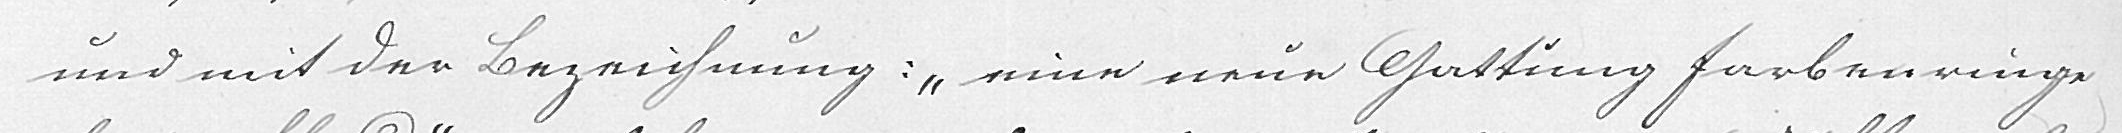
und mit der Bezeichnung "eine neue Gattung Farbenringe
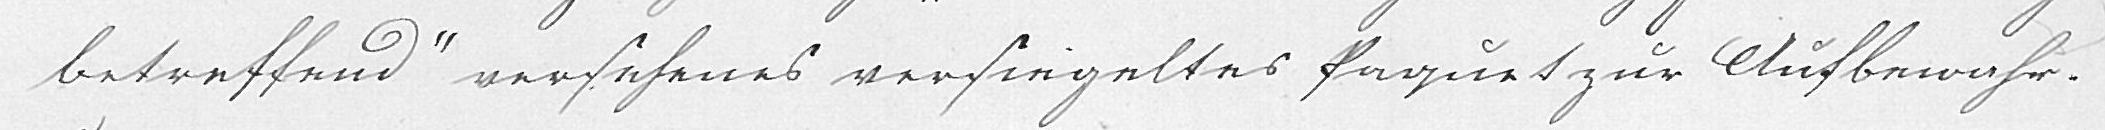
betreffen" versehenes versiegeltes Parquet zur Aufbewahr-
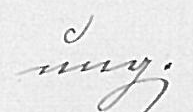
ung.
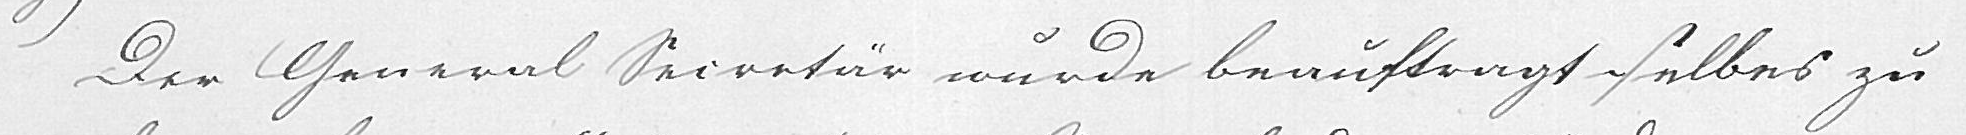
Der General-Secretär wurde beauftragt selbes zu
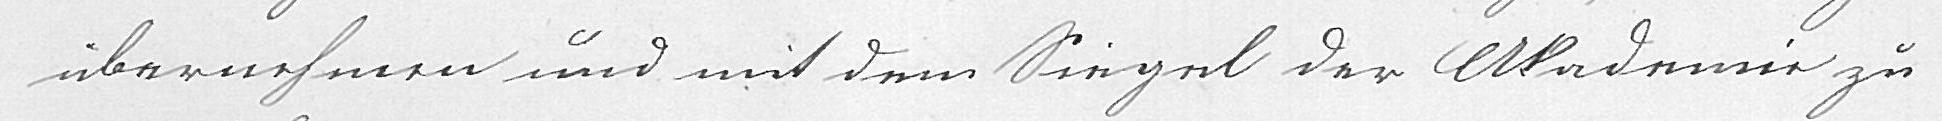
übernehmen und mit dem Siegel der Akademie zu
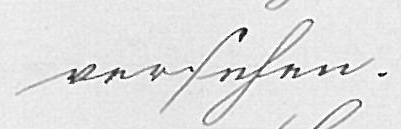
versehen.
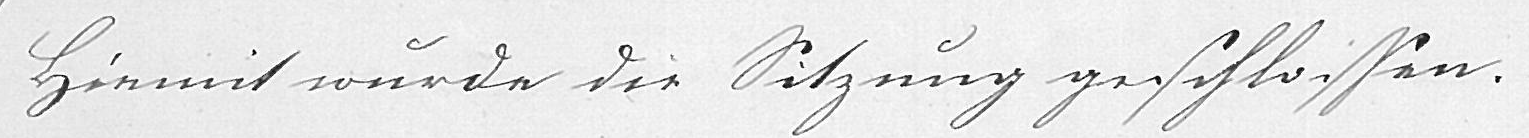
Hiemit wurde die Sitzung geschlossen.
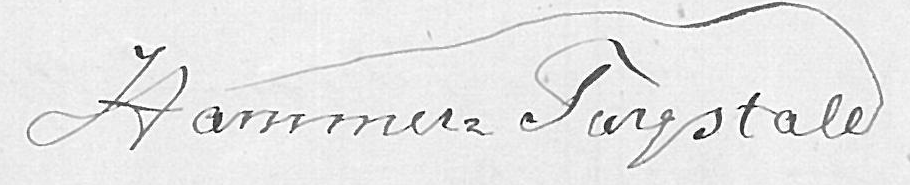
Hammer-Purgstall
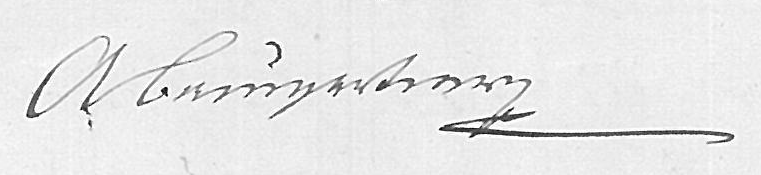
A Baumgartner
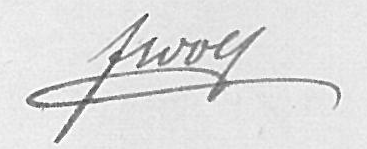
F Wolf
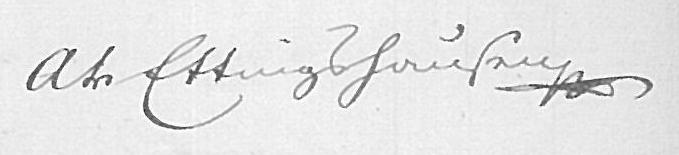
A v Ettingshausen
